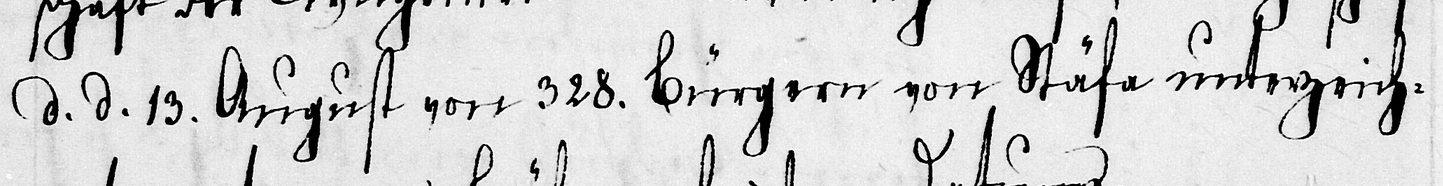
d. d. 13. August von 328. Bürgern von Stäfa unterzeich¬
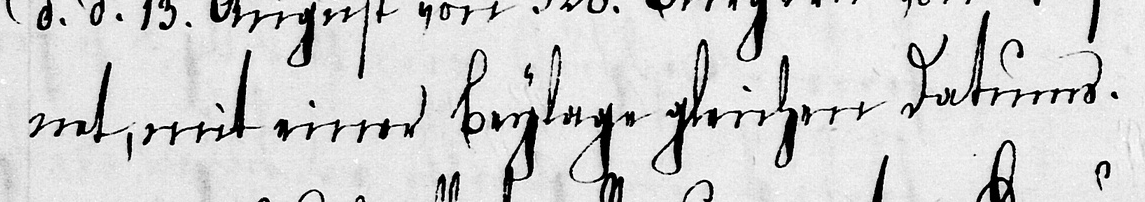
net, mit einer Beylage gleichen Datums.
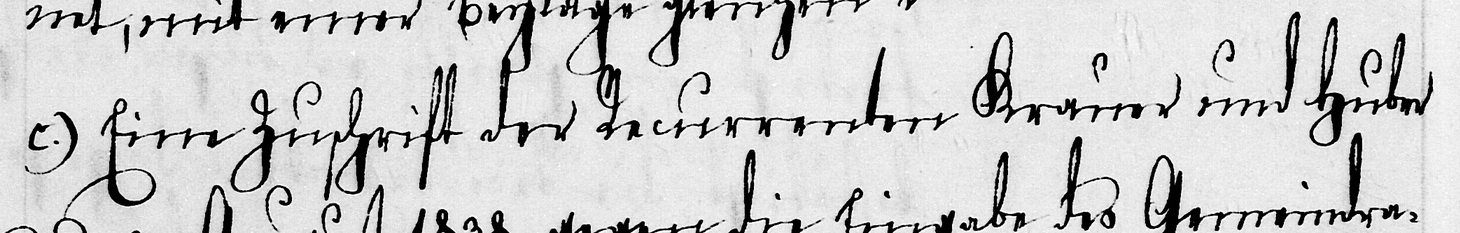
c.) Eine Zuschrift der Recurrenten Krauer und Huber
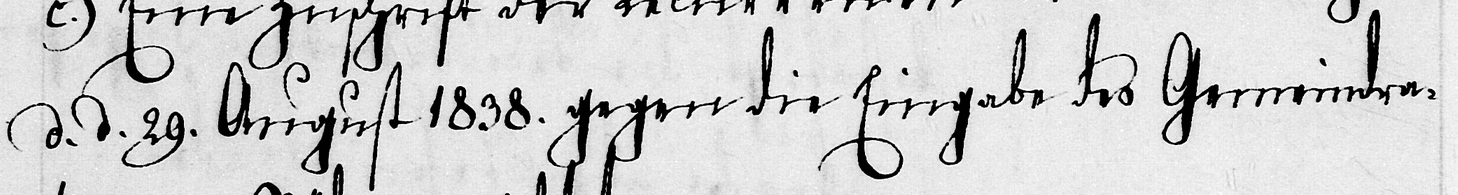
d. d. 29. August 1838. gegen die Eingabe des Gemeindra¬
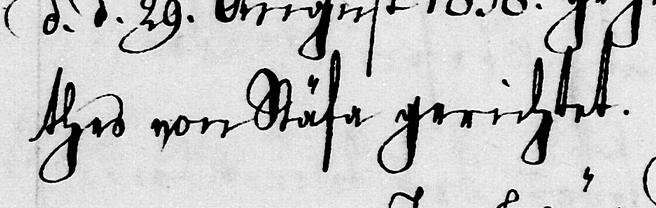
thes von Stäfa gerichtet.
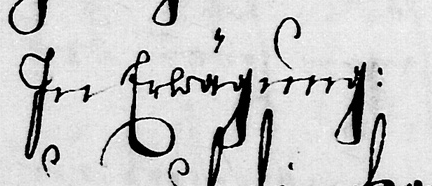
In Erwägung:
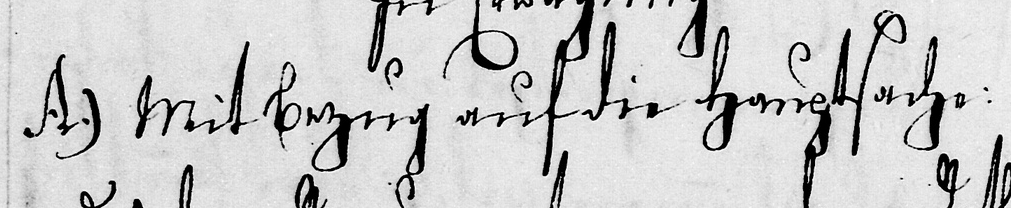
A.) Mit Bezug auf die Hauptsache:
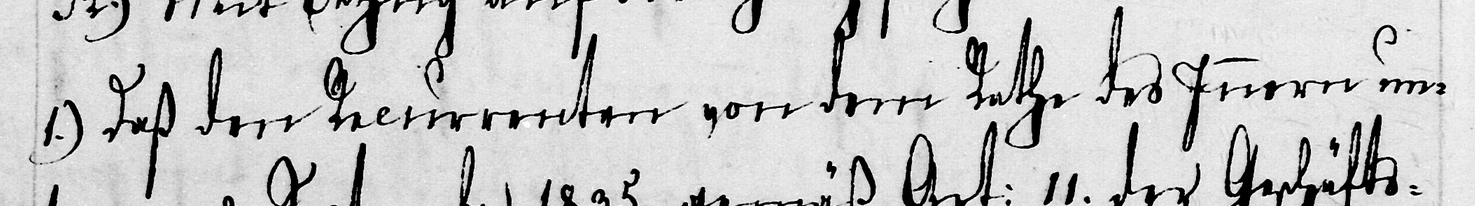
1.) Daß den Recurrenten von dem Rathe des Innern un¬
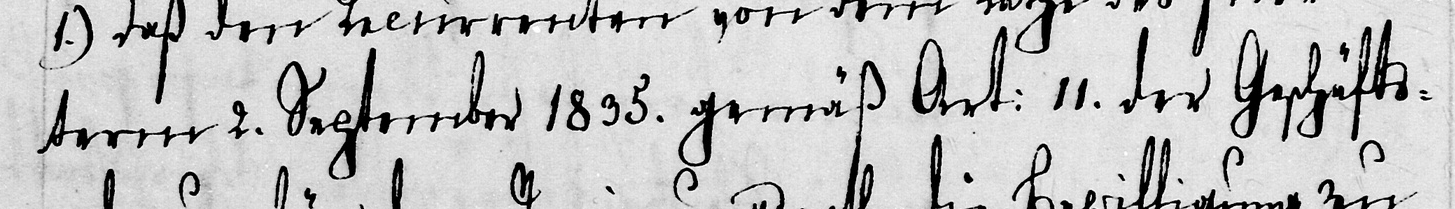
term 2. September 1838. gemäß Art: 11. der Geschäfts¬
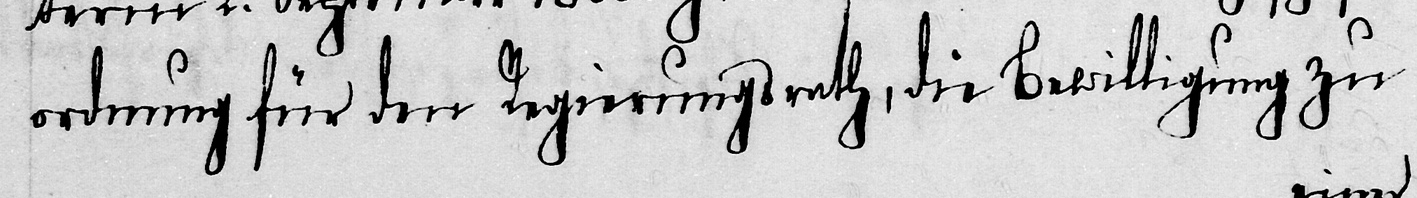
ordnung für den Regierungsrath, die Bewilligung zu
